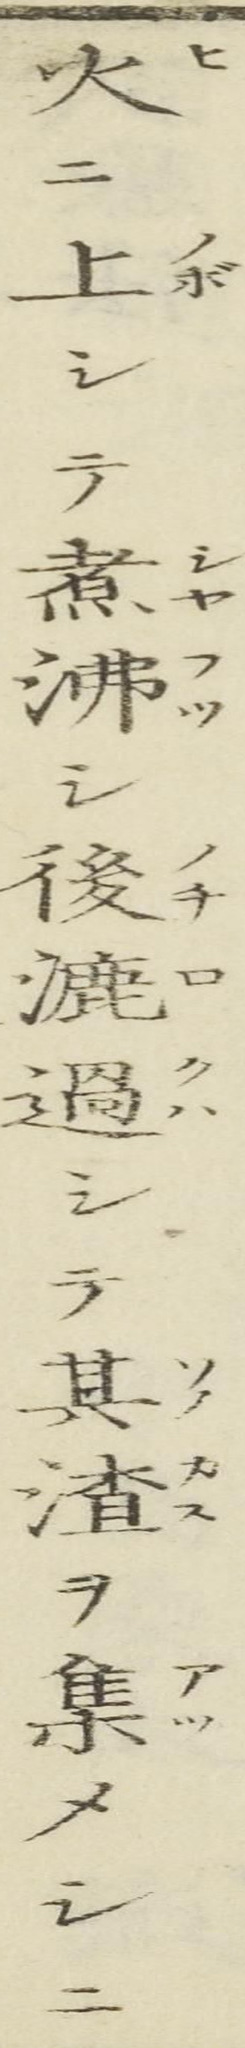火ニ上シテ煮沸シ後濾過シテ其渣ヲ集メシニ
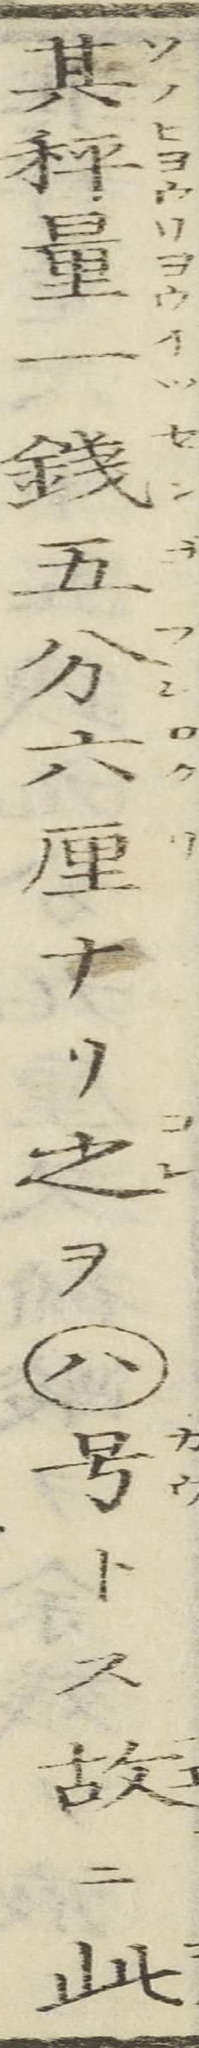其秤量一銭五分六厘ナリ之ヲ㋩号トス故ニ此
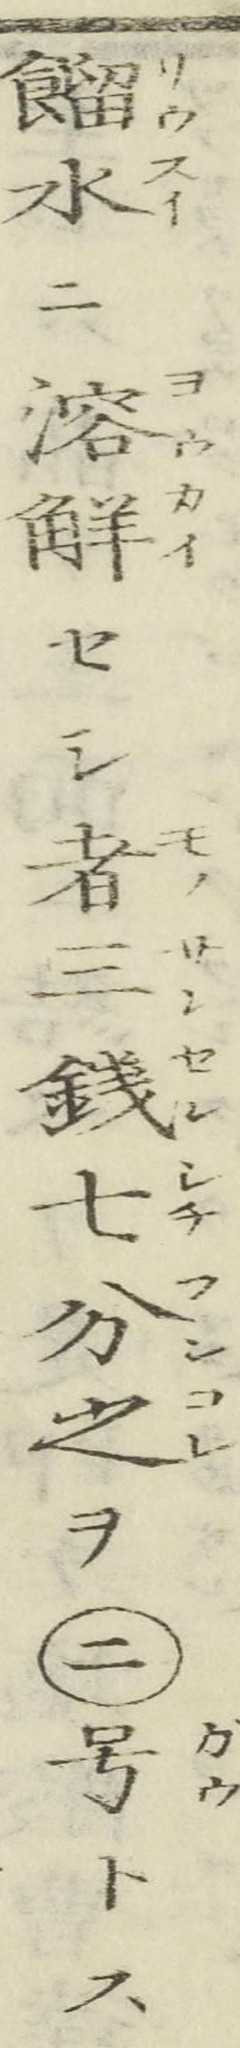溜水ニ溶解セシ者三銭七分之ヲ㊁号トス
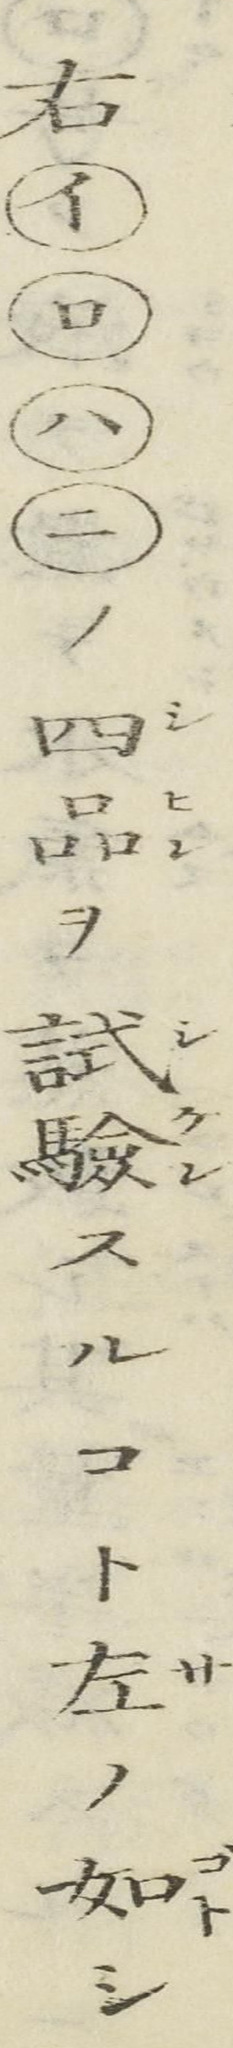右㋑㋺㋩㊁ノ四品ヲ試験スルコト左ノ如シ
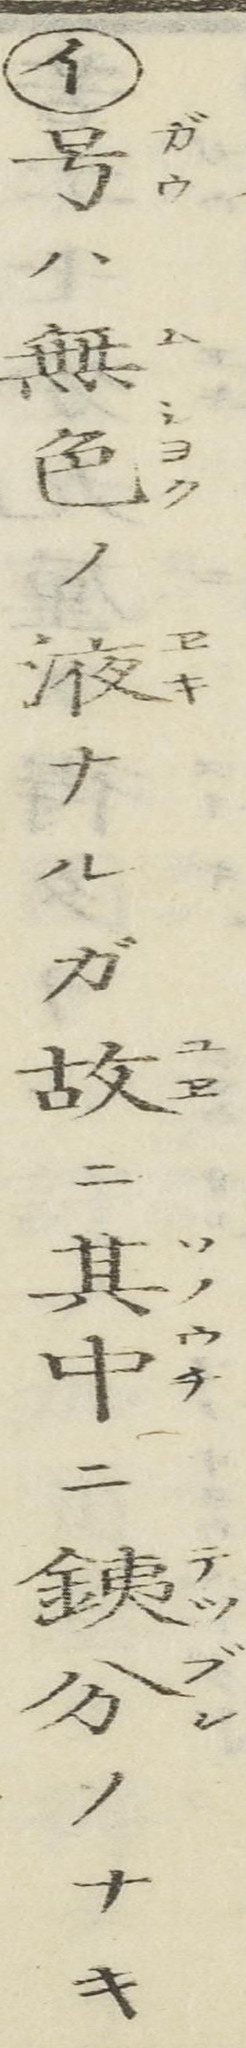㋑号ハ無色ノ液ナルガ故ニ其中ニ鉄分ノナキ
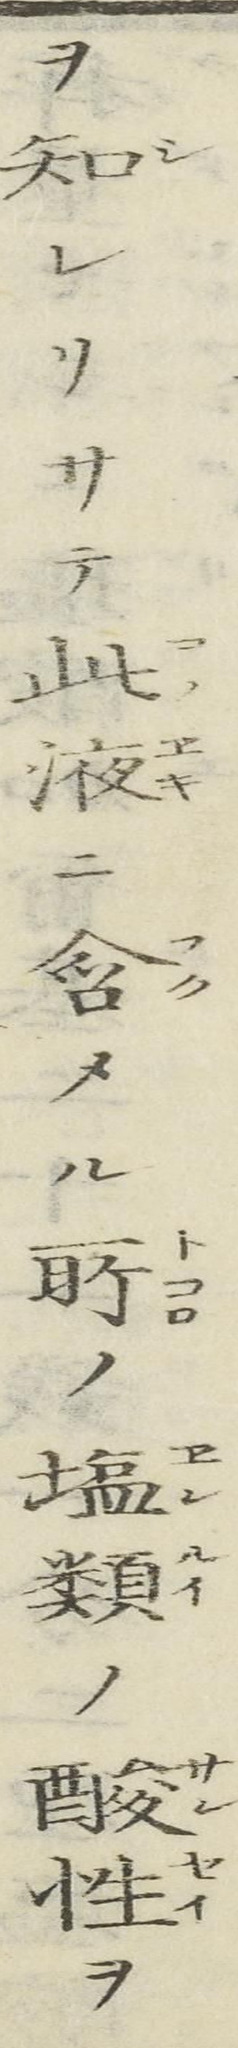ヲ知レリサテ此液ニ含メル所ノ塩類ノ酸性ヲ
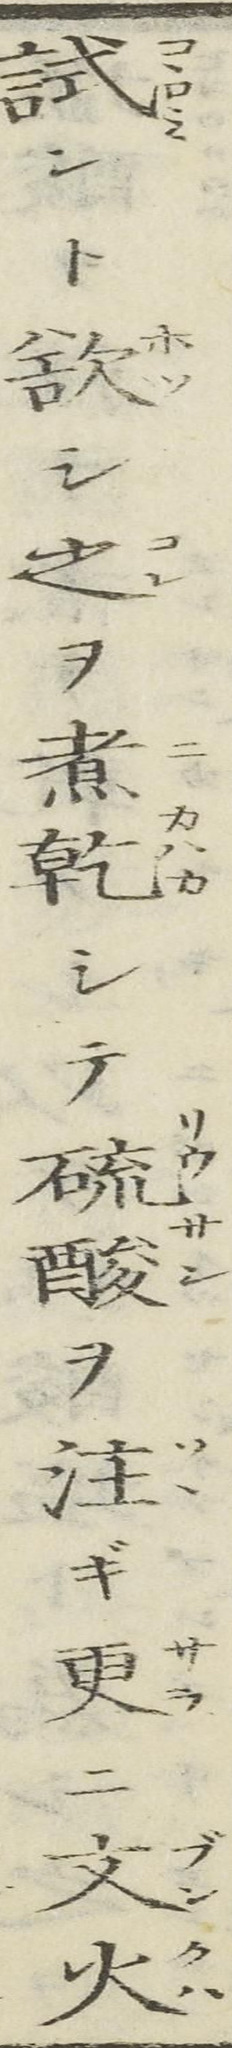試ント欲シ之ヲ煮乾シテ硫酸ヲ注ギ更ニ文火
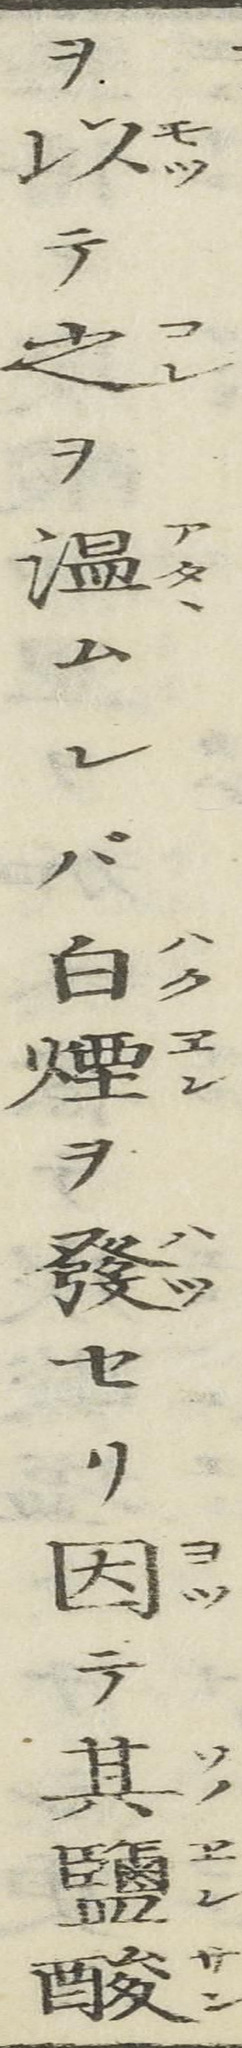ヲ以テ之ヲ温ムレバ白煙ヲ発セリ因テ其塩酸
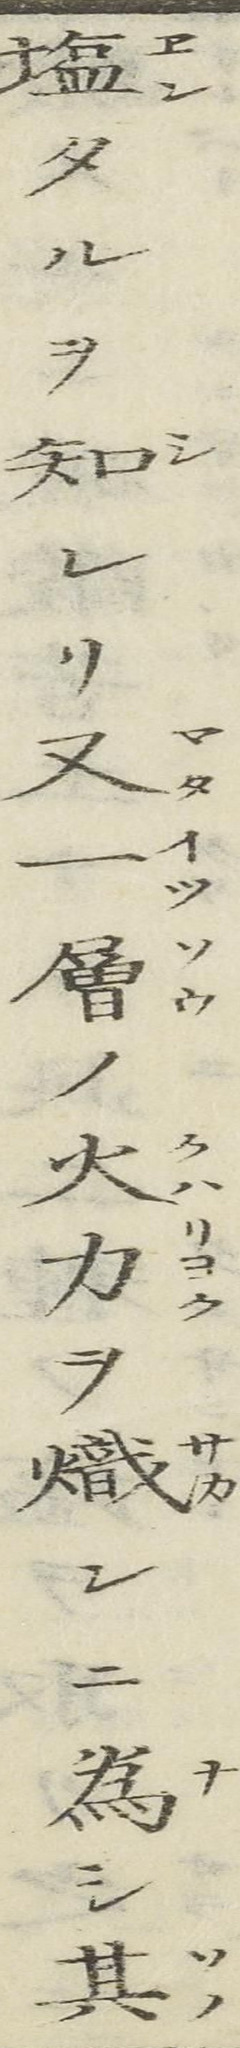塩タルヲ知レリ又一層ノ火力ヲ熾ンニ為シ其
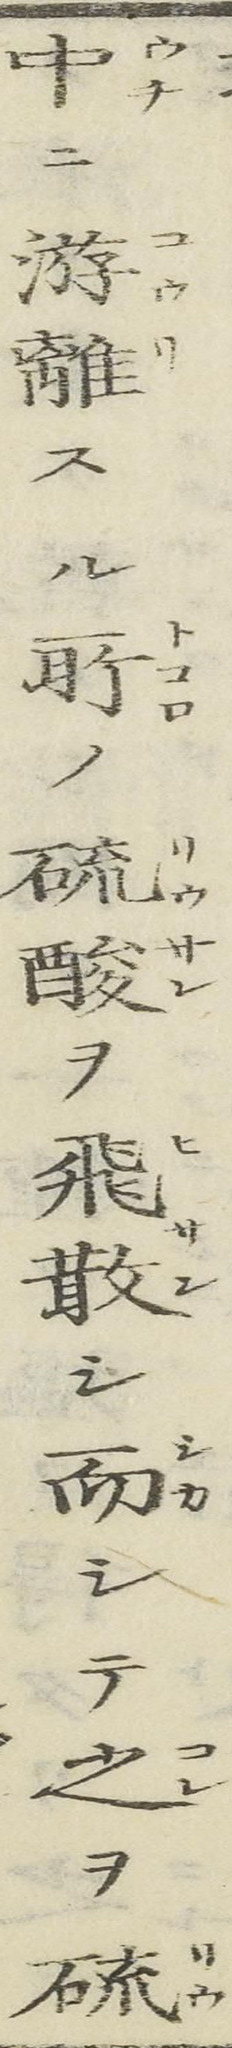中ニ游離スル所ノ硫酸ヲ飛散シ而シテ之ヲ硫
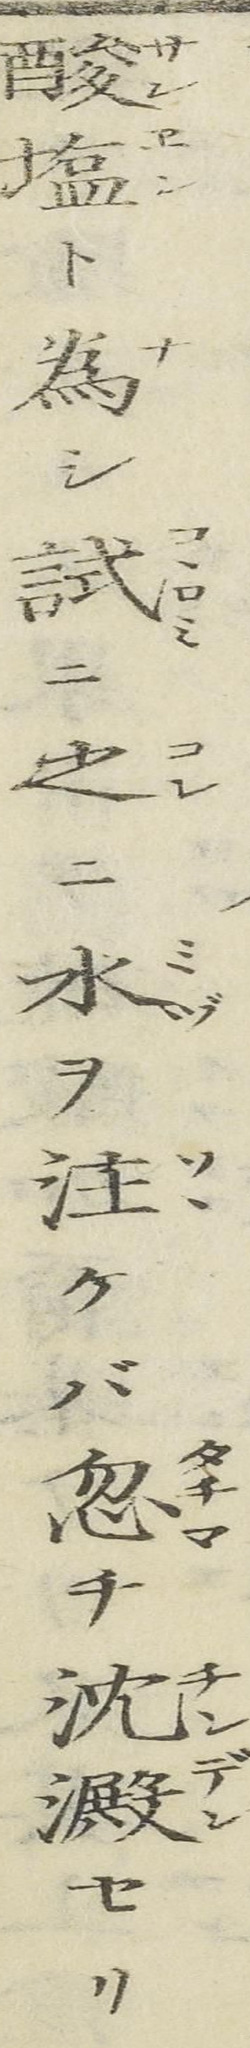酸塩ト為シ試ニ之ニ水ヲ注ケバ忽チ沈澱セリ

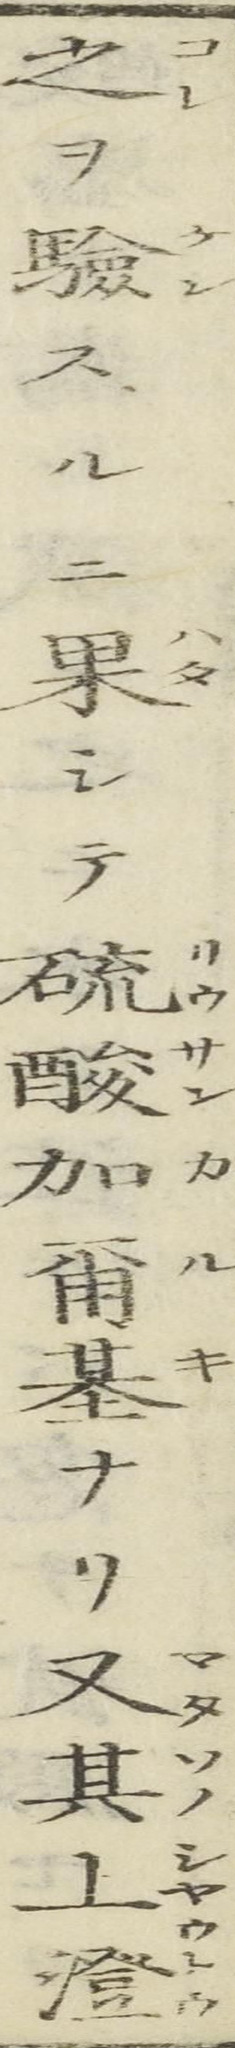之ヲ験スルニ果シテ硫酸加爾基ナリ又其上澄
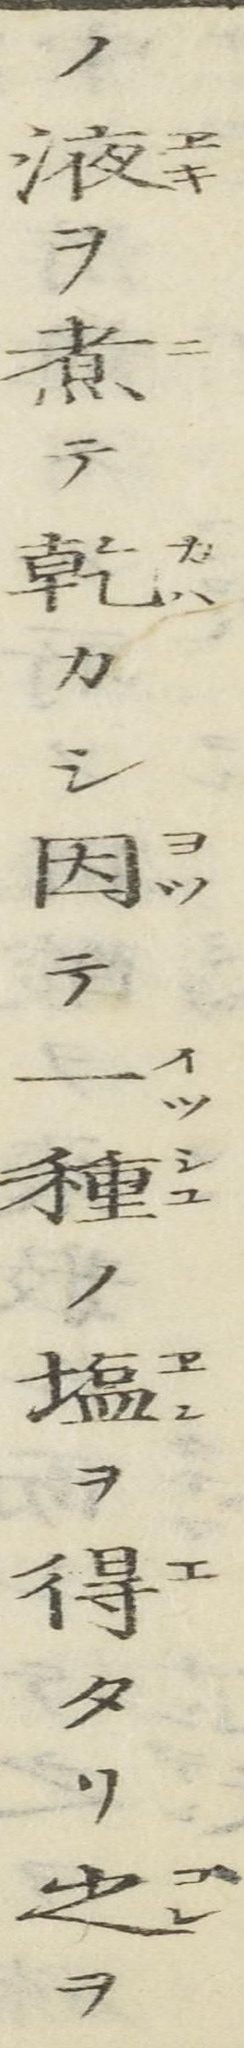ノ液ヲ煮テ乾カシ因テ一種ノ塩ヲ得タリ之ヲ
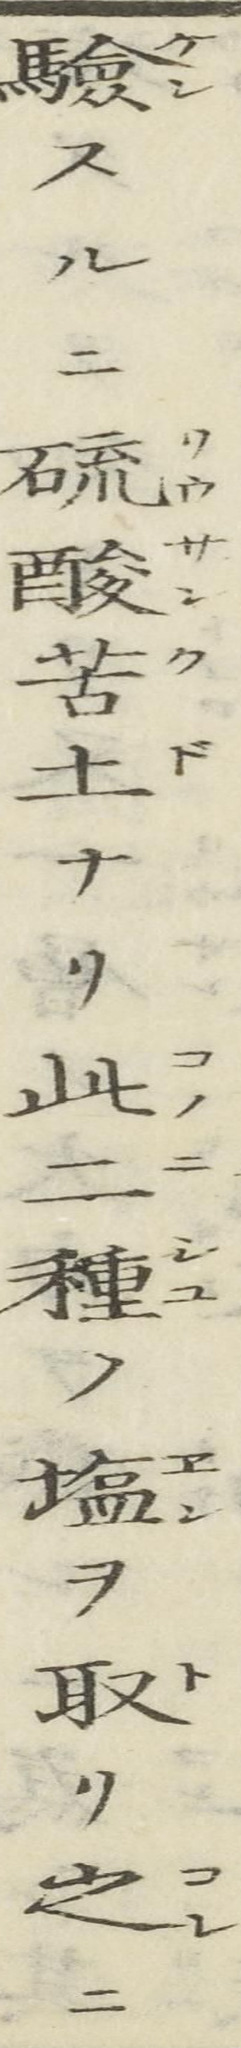験スルニ硫酸苦土ナリ此二種ノ塩ヲ取リ之ニ
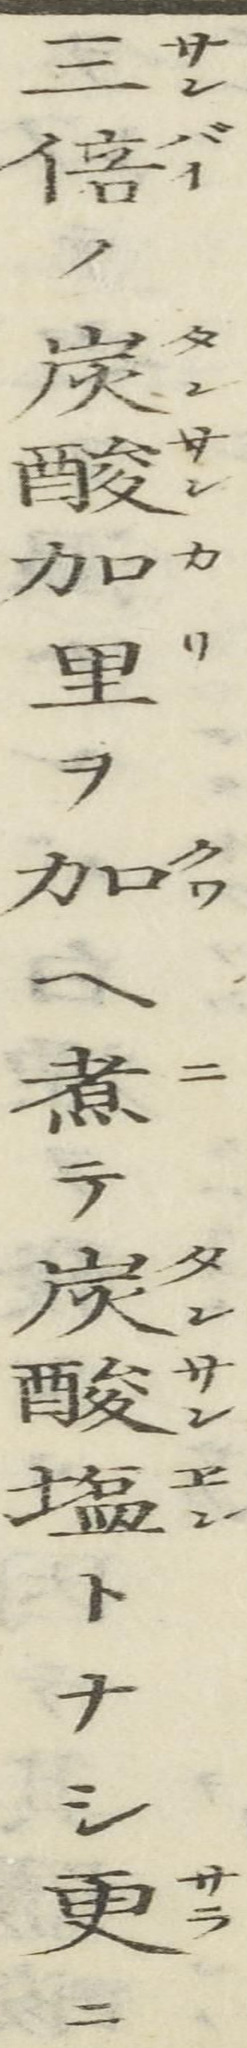三倍ノ炭酸加里ヲ加ヘ煮テ炭酸塩トナシ更ニ
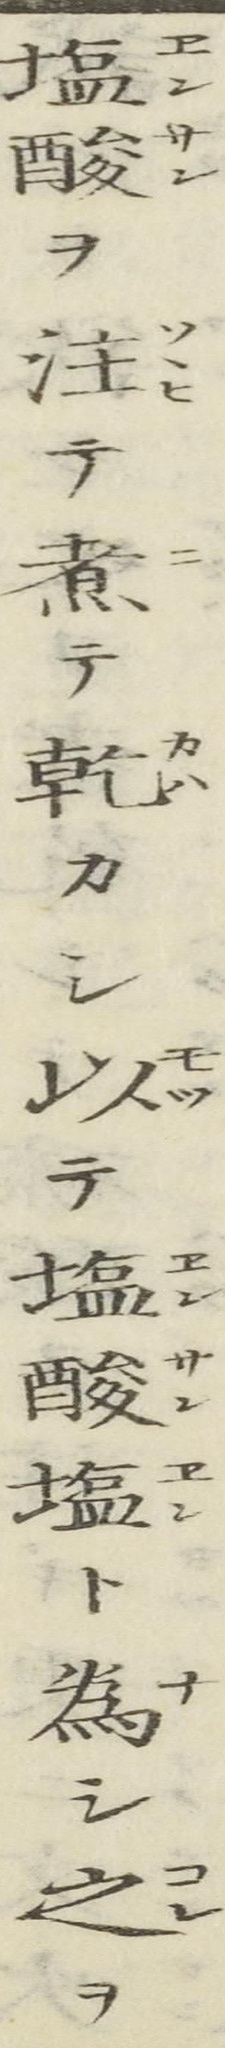塩酸ヲ注テ煮テ乾カシ以テ塩酸塩ト為シ之ヲ
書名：熱海温泉考　全
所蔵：東京大学地震研究所図書室 Earthquake Research Institute Library, The University of Tokyo, JAPAN
